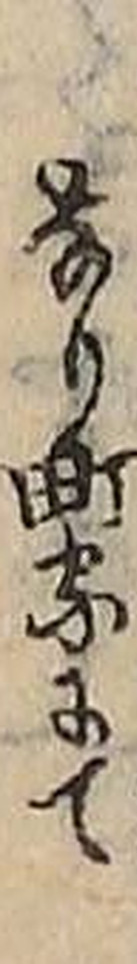なり町家にて
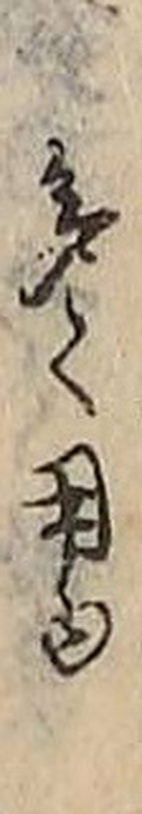多く用ゆ
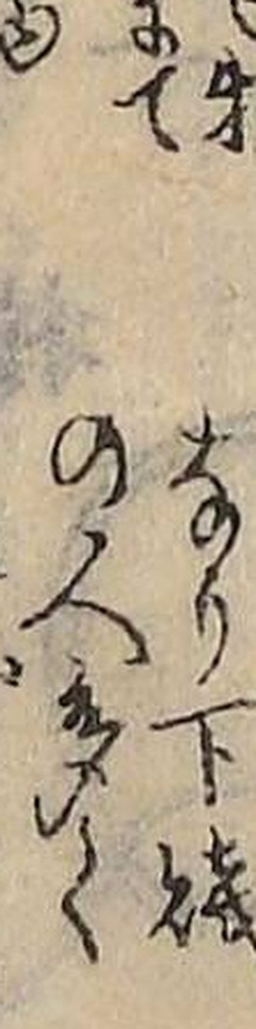の人多く
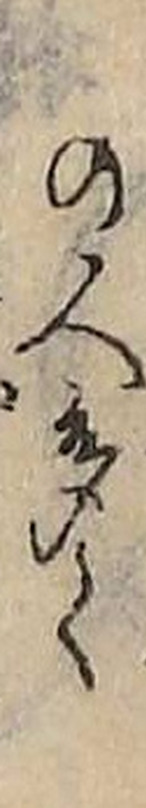の人多く
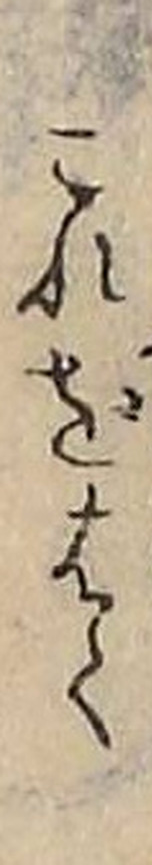これをはく

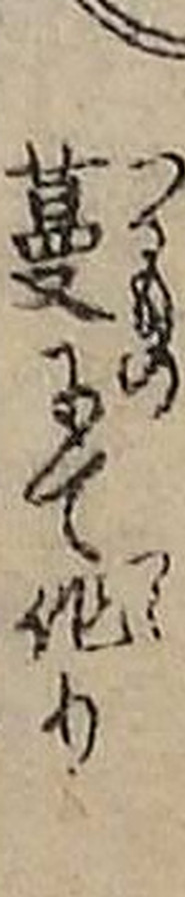蔓にて作り
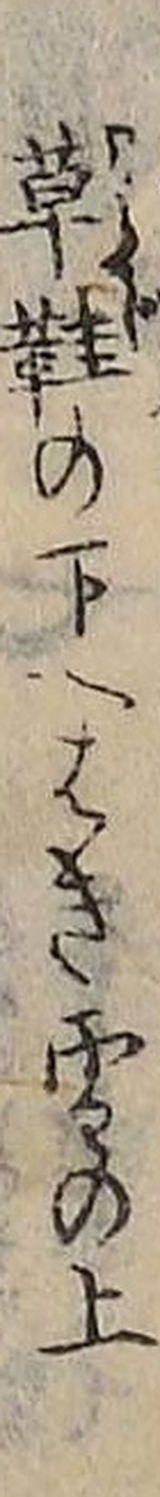草鞋の下へはき雪の上
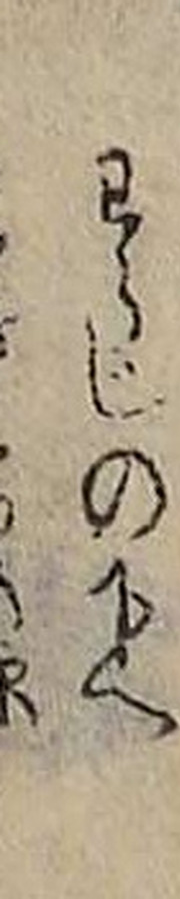わらじの下へ
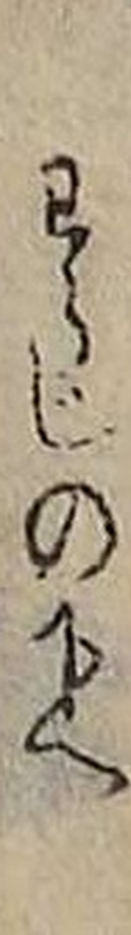わらじの下へ
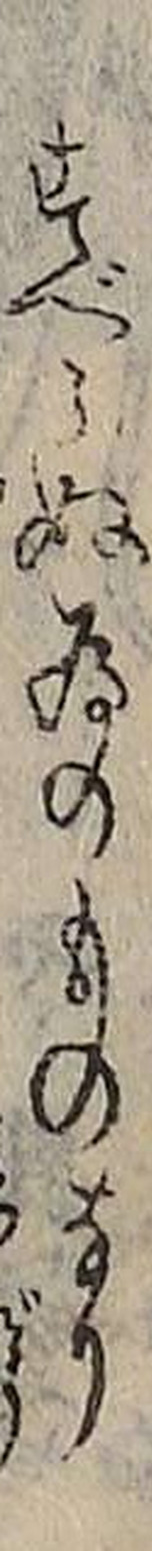すべらぬ為のものなり
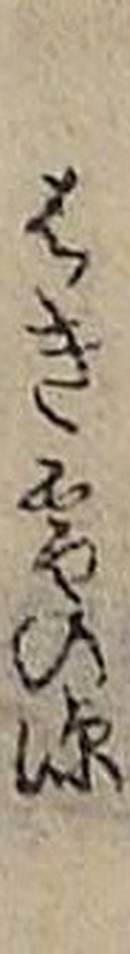はき雪の深
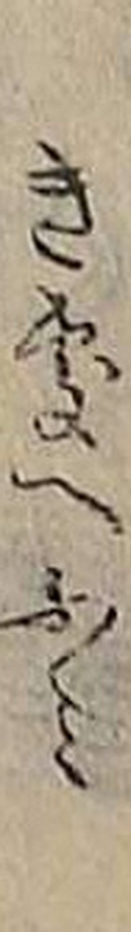き処へふみ
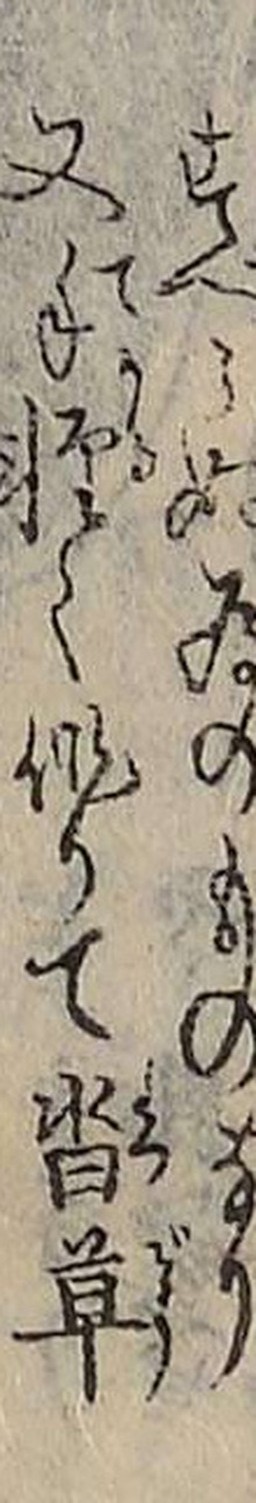又手軽く作りて沓草
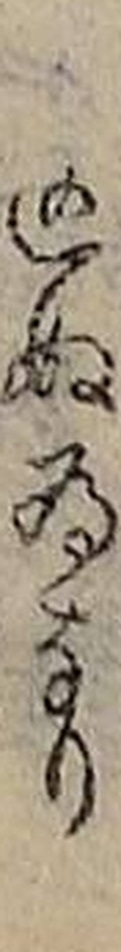込ぬ為なり
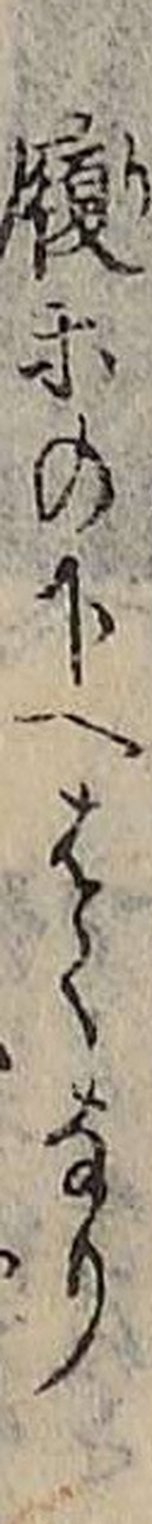履等の下へはくなり
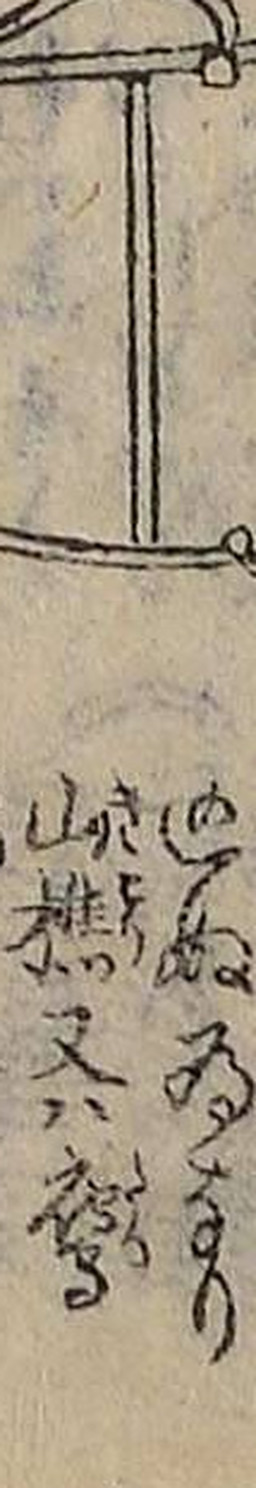山樵又は鷹
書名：旅行用心集
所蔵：神戸大学附属図書館 国文学研究資料館
